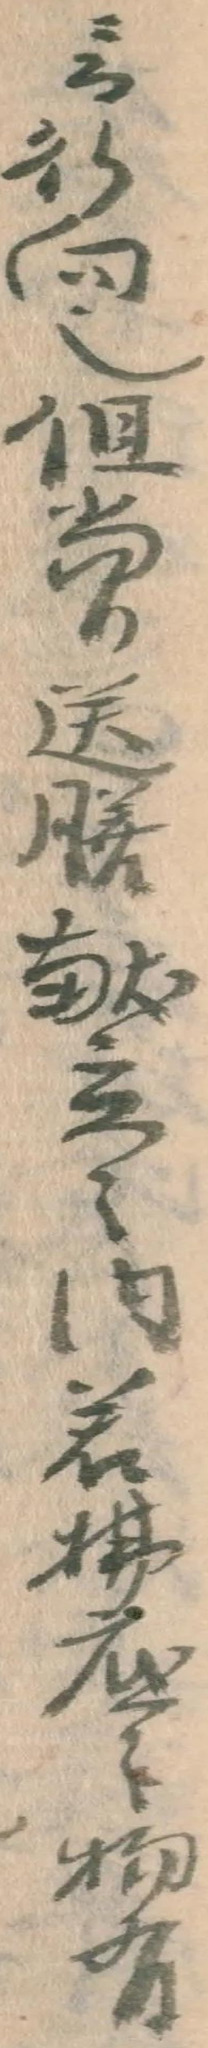ニ而行向也、但當日送膳献立之内、若払底之物有
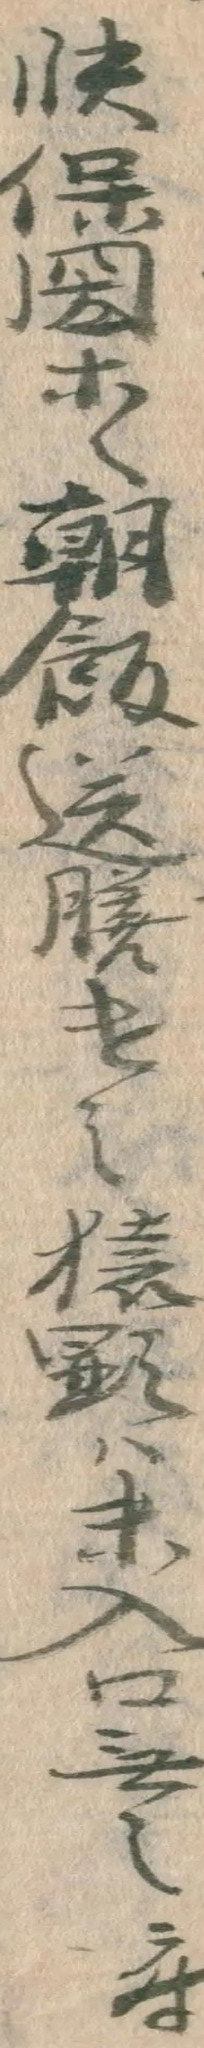快・保圀等へ朝飯送膳遣之、猿顕ハ未入口無之ニ付
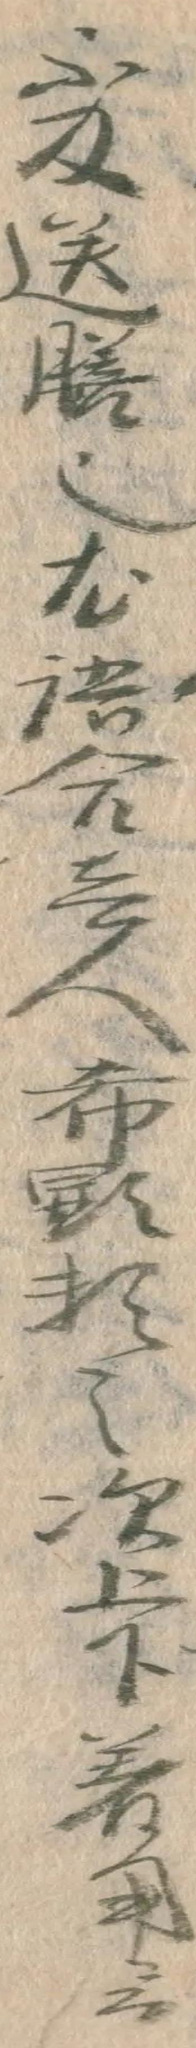不及送膳也、尤詰合壱人希顕頼之、次上下着用ニ而
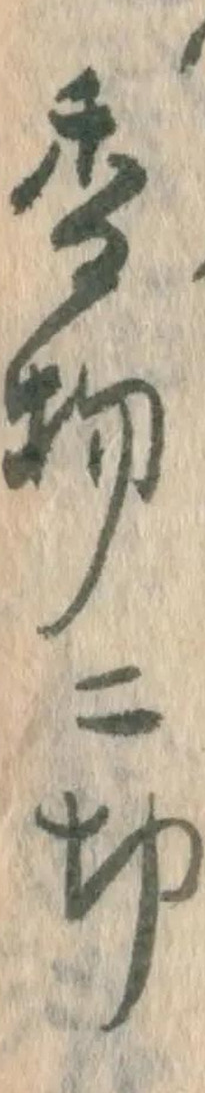香物二切

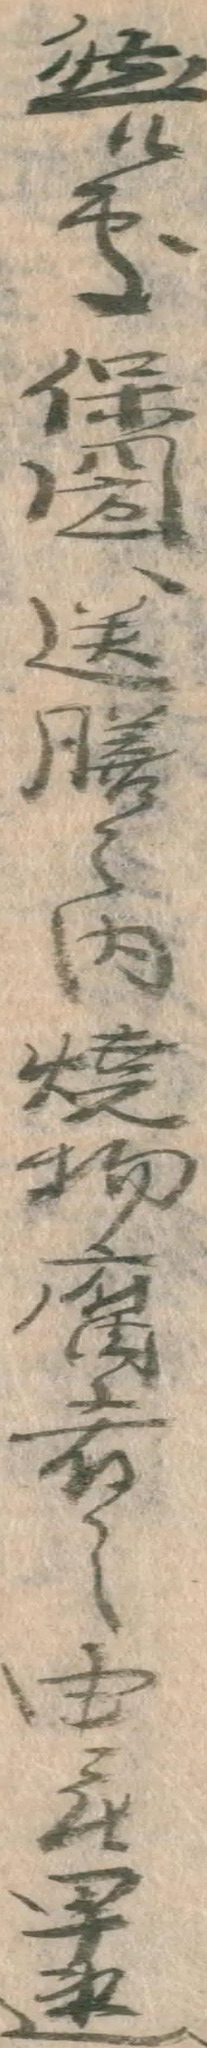然ル處、保圀へ送膳之内、焼物腐者之由ニ付、早速
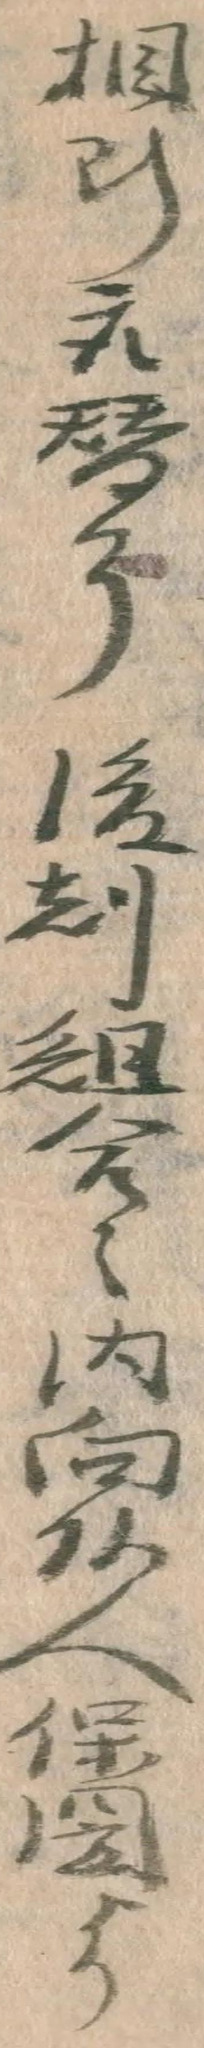相断取替候了、後刻組合之内、向頭人保圀より
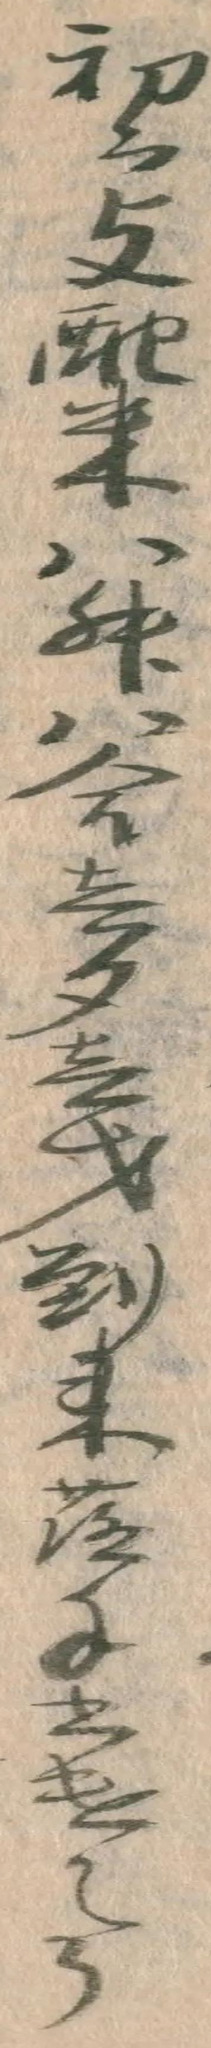初而支配米八升八合壱勺壱才到来、落手書遣之了、
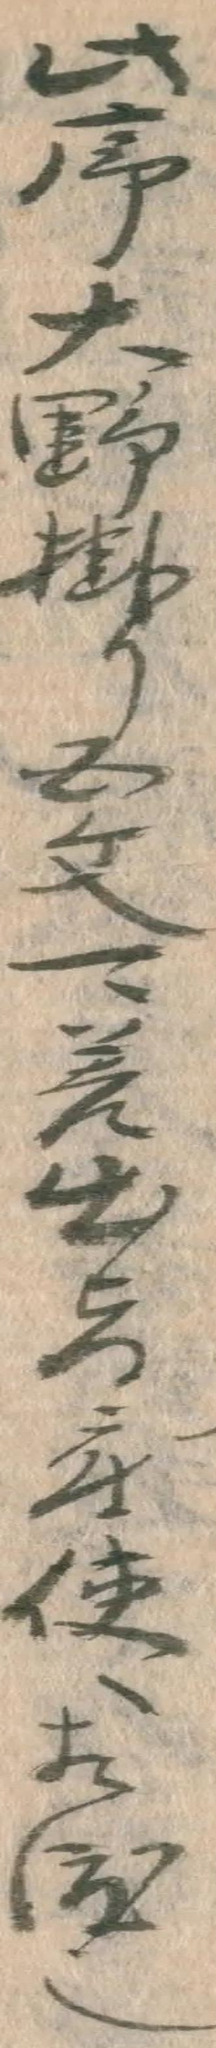此序大野掛り五文可差出旨ニ付、使へ相渡也、
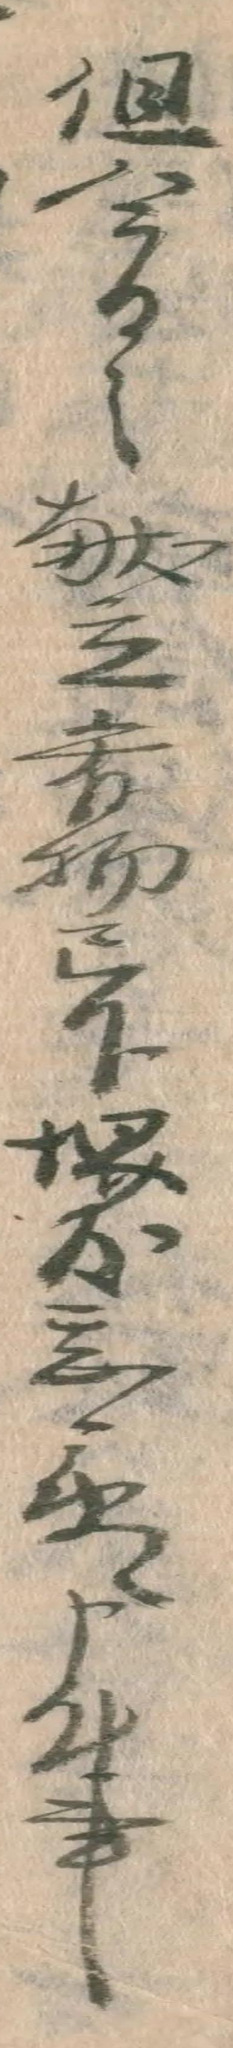但今日之献立肴物已下堺屋甚兵衛へ申付事、
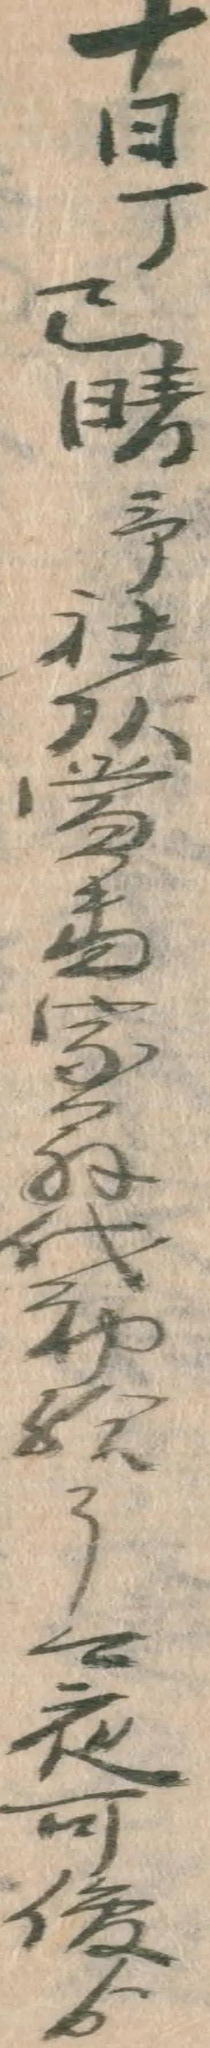十日丁巳晴、予社頂當番家翁代勤給了、今夜可俊ゟ
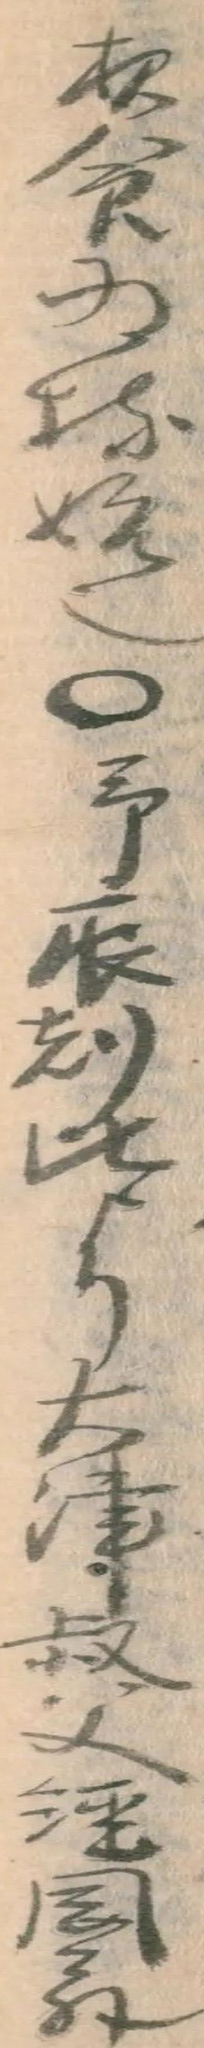夜食為持始也、○予辰刻比より大津叔父経岡翁
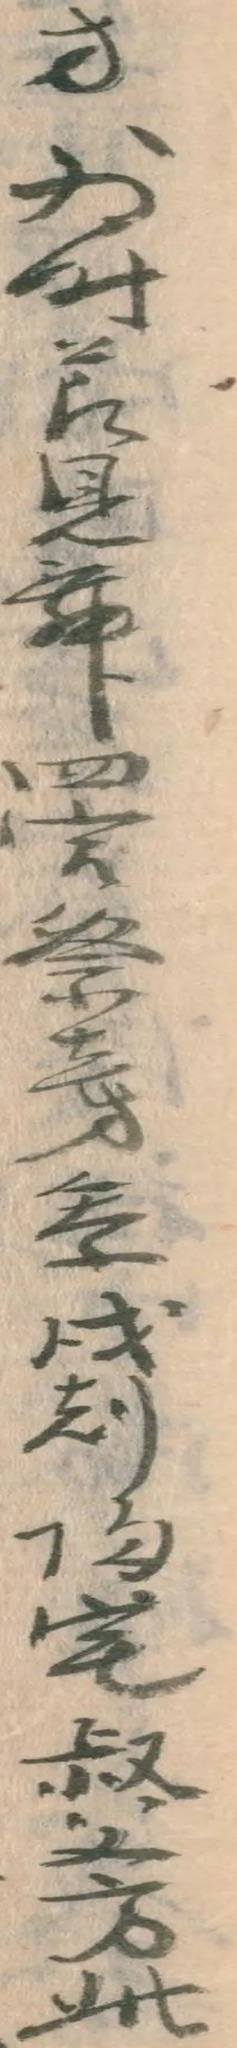方へ為時節見舞四宮祭参、戌刻帰宅、叔父方此
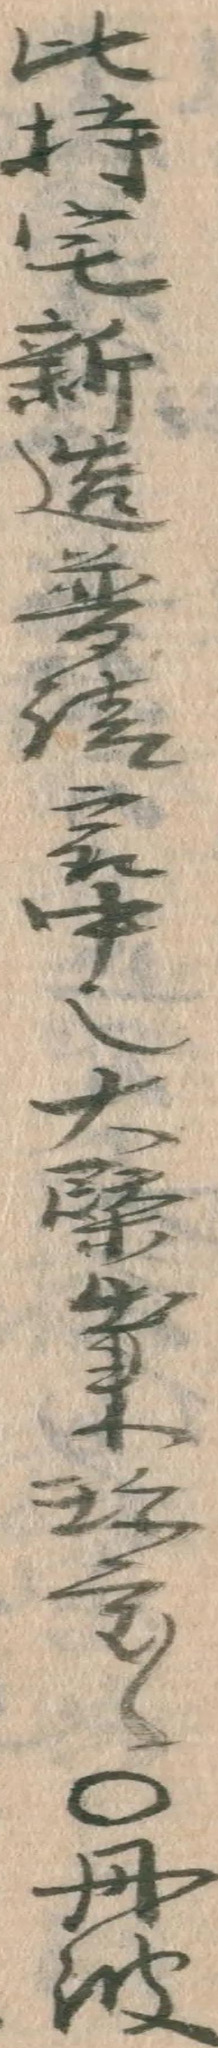比持宅新造普請最中也、大堅出来珍重〳〵○丹波
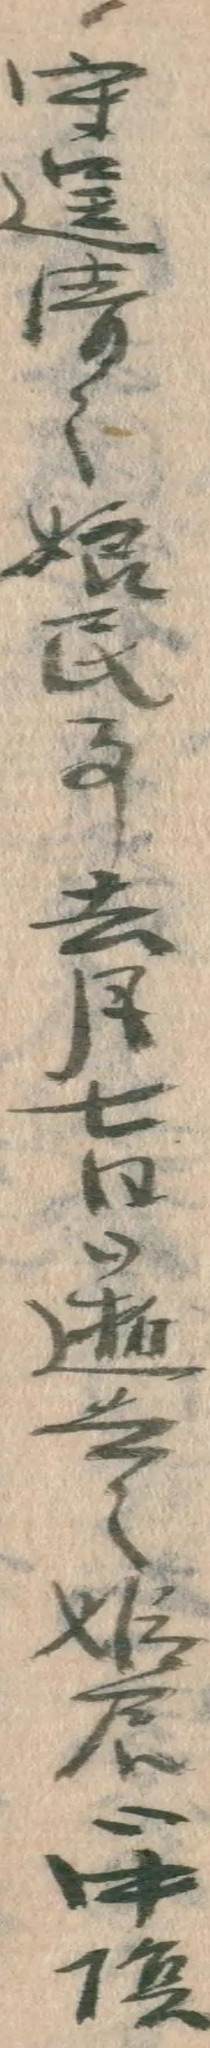守逞清之娘民事、去月七日御逝去之姫君御中陰
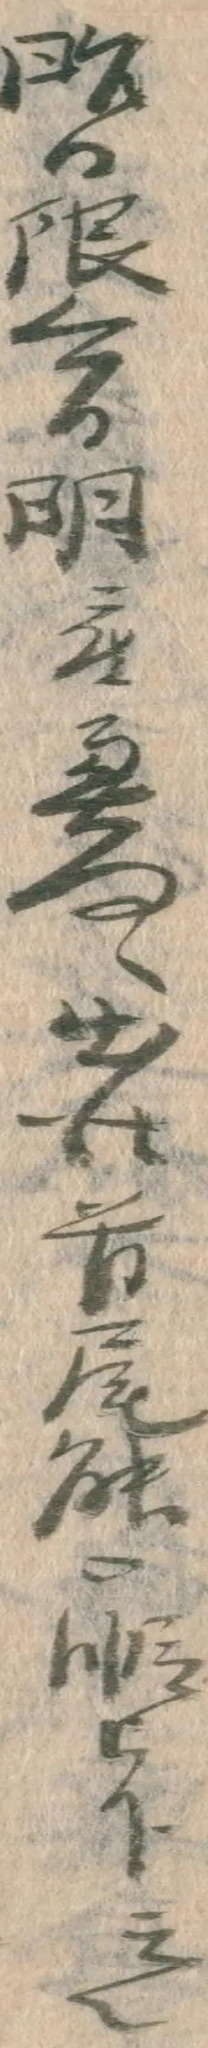昨日限、今日明ニ付奥向へ出仕、首尾能御暇被下云々、
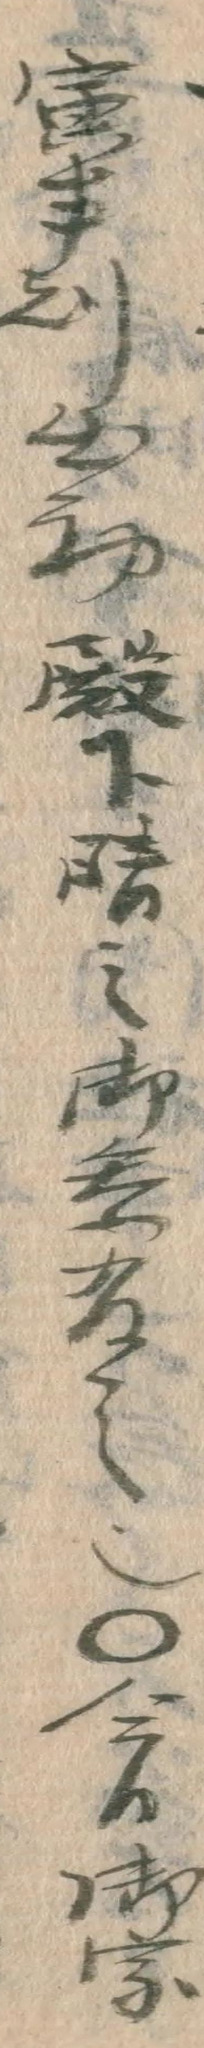寅半刻出勤、殿下晴之御参有之也、○今日御家
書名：賀茂社記録. 第63冊
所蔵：国立国会図書館 National Diet Library, JAPAN
